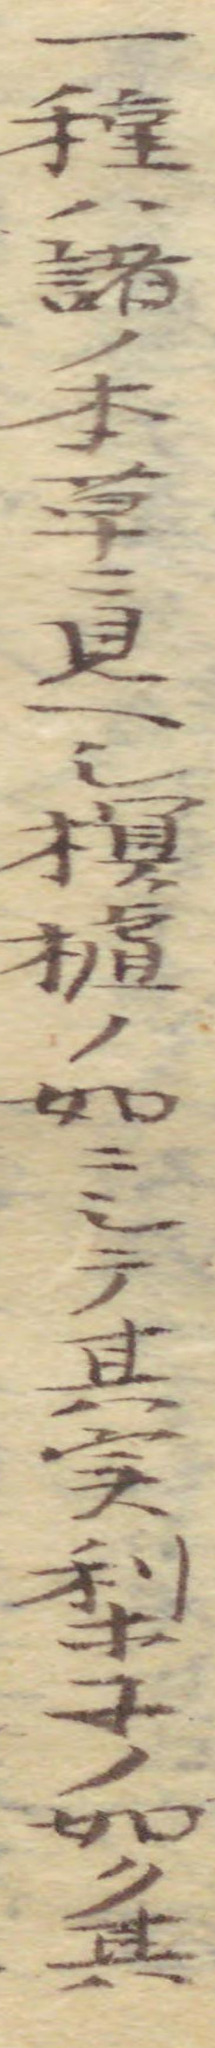一種ハ諸ノ本草ニ見ヘシ榠樝ノ如ニシテ其実梨子ノ如ク其
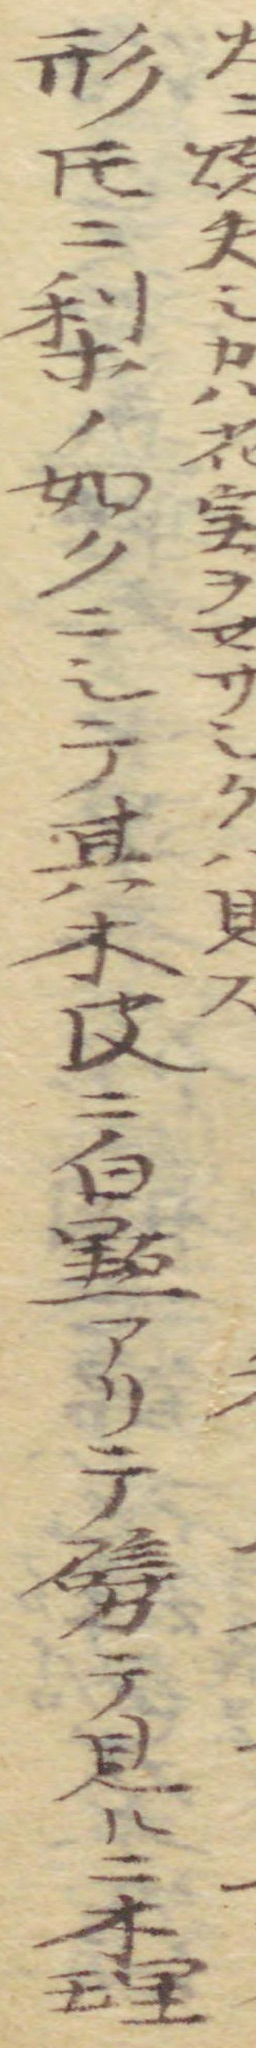形トモニ梨ノ如クニシテ其木皮ニ白点アリテ劈テ見ルニ木理
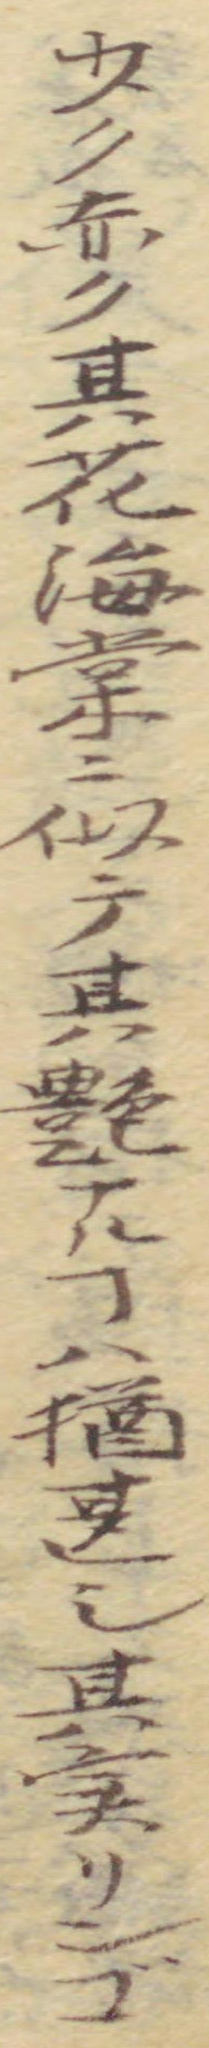少ク赤ク其花海棠ニ似テ其艶ナルコトハ猶甚シ其実リンゴ
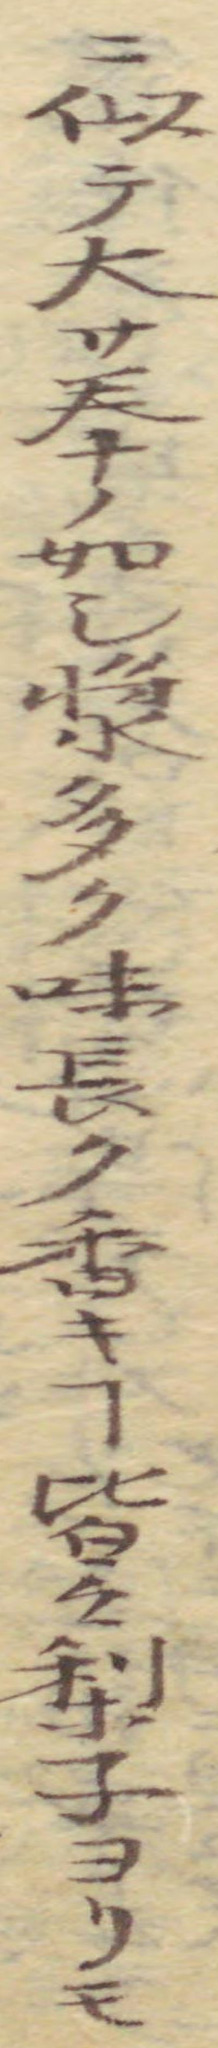ニ似テ大サ拳ノ如シ漿多ク味長ク香キコト皆々梨子ヨリモ
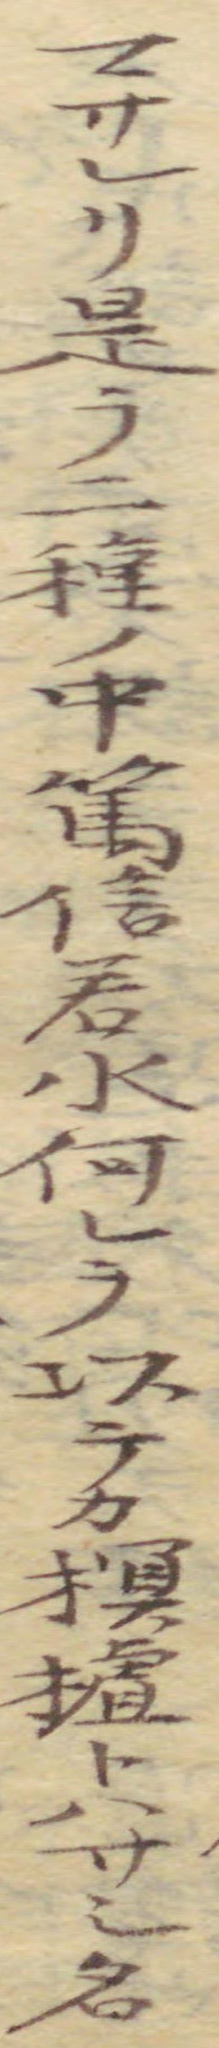マサレリ是ラ二種ノ中篤信若水何レヲ以テカ榠樝トハサシ名
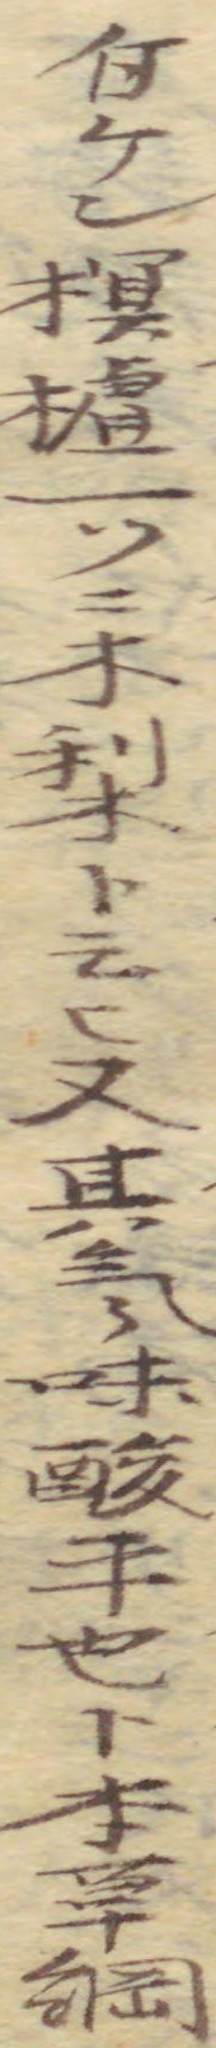付ケン榠樝一ツニ木梨ト云ヒ又其気味酸平也ト本草綱
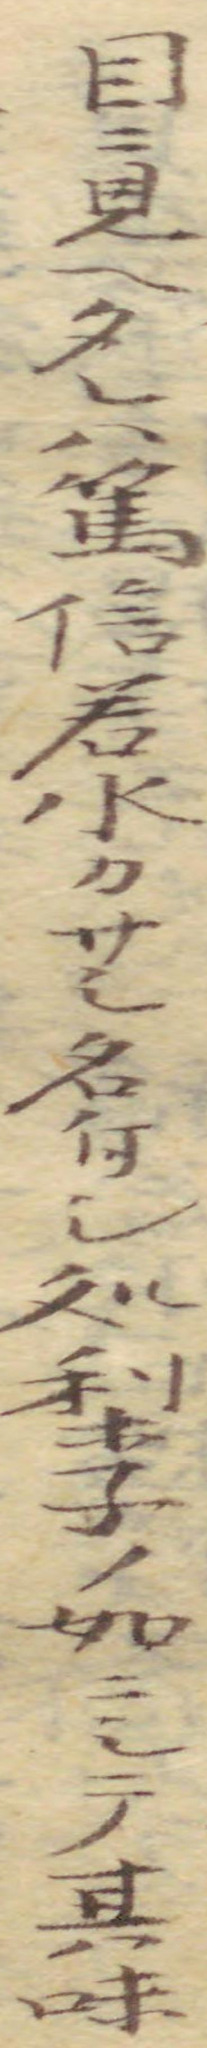目ニ見ヘタレハ篤信若水カサシ名付シ処梨子ノ如ニシテ其味
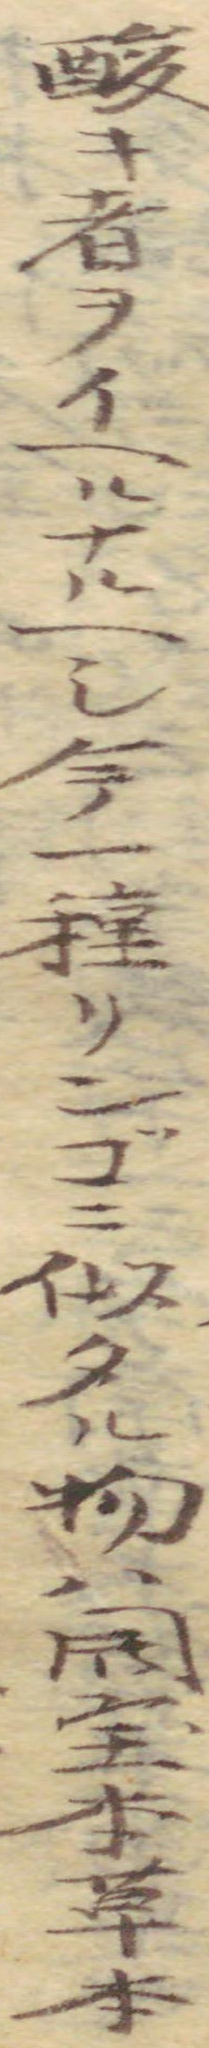酸キ者ヲイヘルナルヘシ今一種リンゴニ似タル物ハ開宝本草本
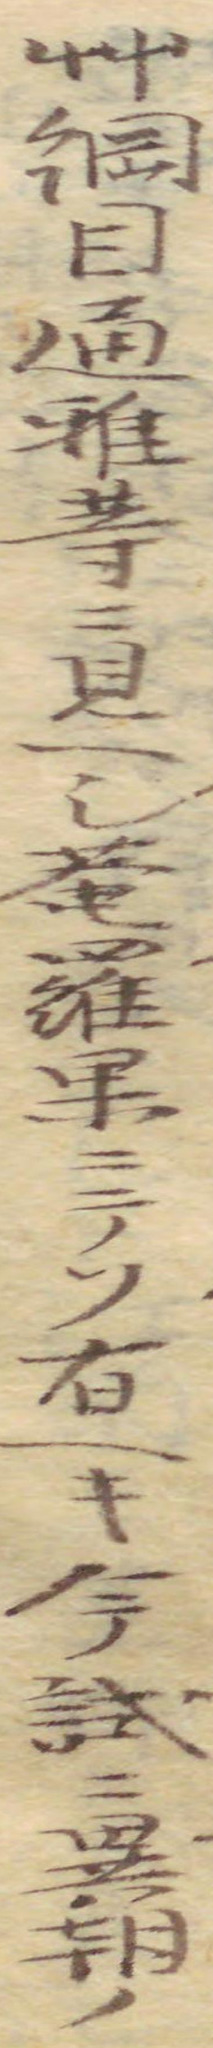草綱目通雅等ニ見ヘシ菴羅果ニテソ有ヘキ今試ニ異朝ノ
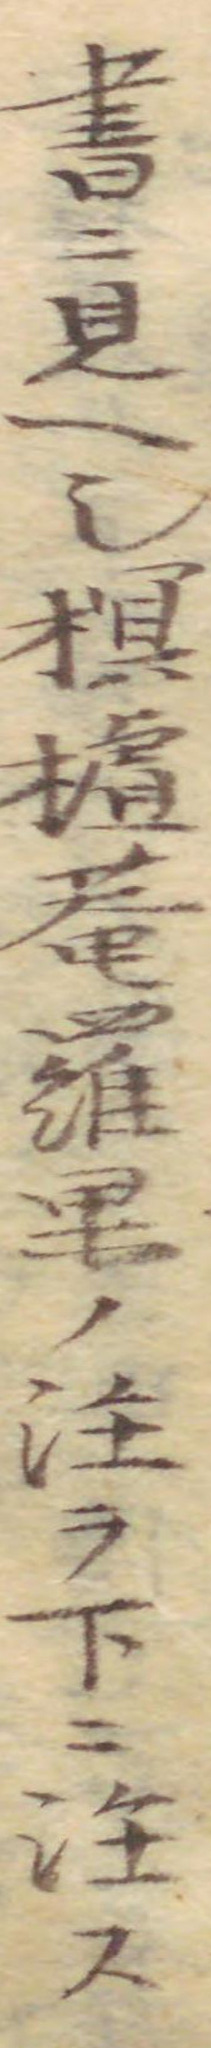書ニ見ヘシ榠樝菴羅果ノ注ヲ下ニ注ス
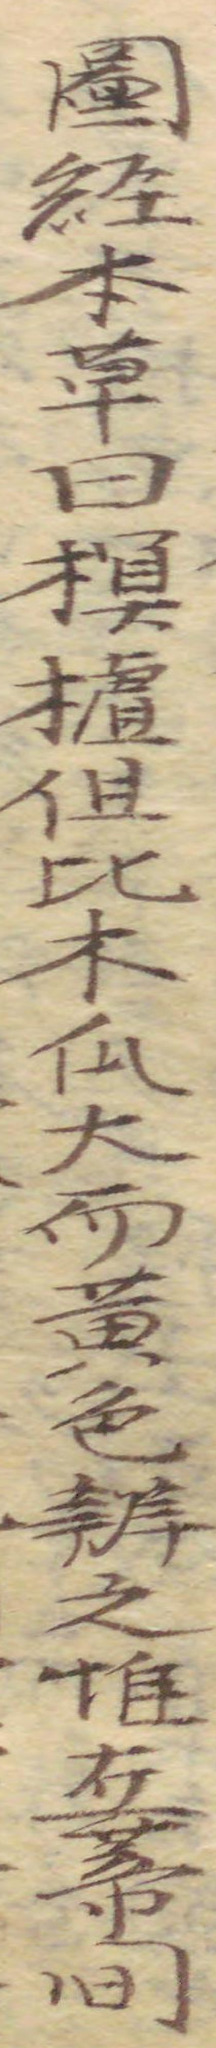図経本草曰榠樝但比木瓜大而黄色弁之惟在蒂間

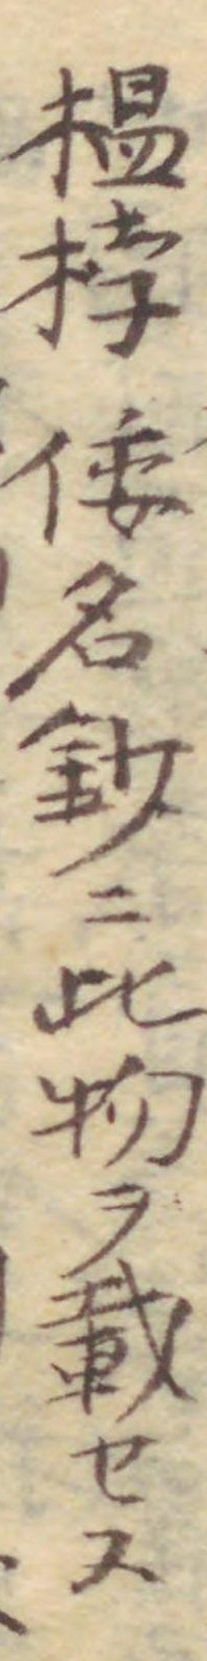榲桲倭名鈔ニ此物ヲ載セス
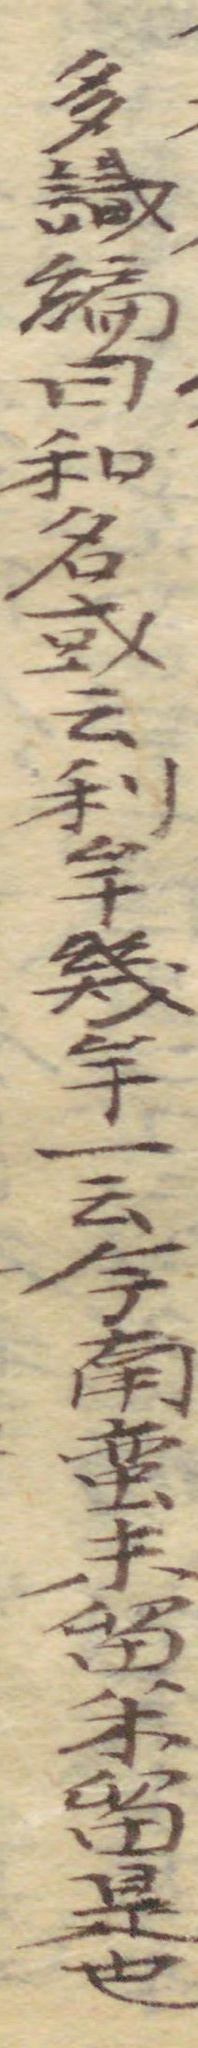多識編曰和名或云利牟幾牟一云今南蛮未留米留是也
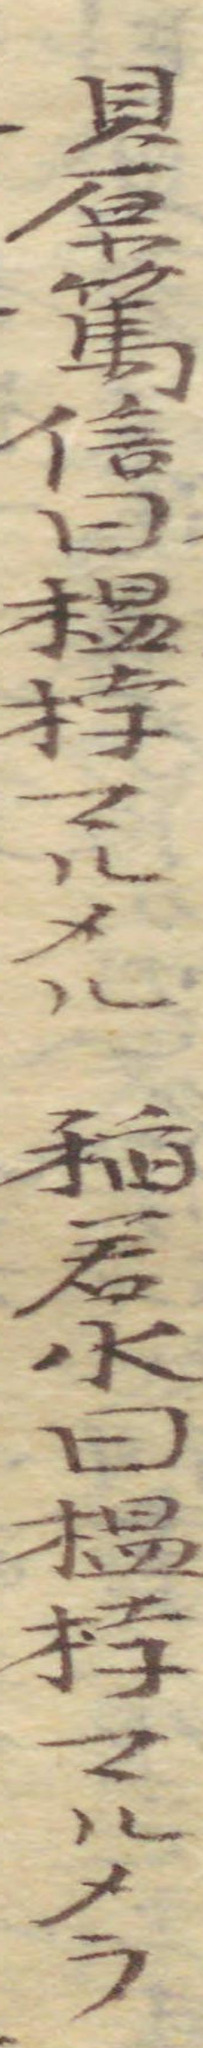貝原篤信曰榲桲マルメル稲若水曰榲桲マルメラ
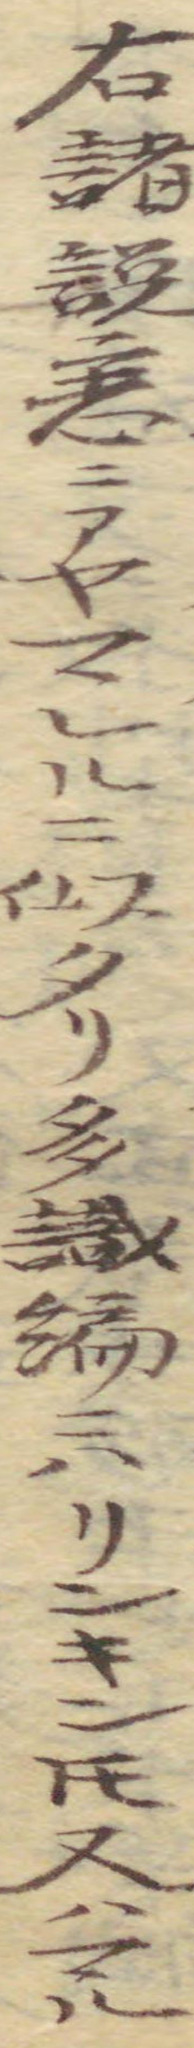右諸説悉ニアヤマレルニ似タリ多識編ニハリンキントモ又ハマル
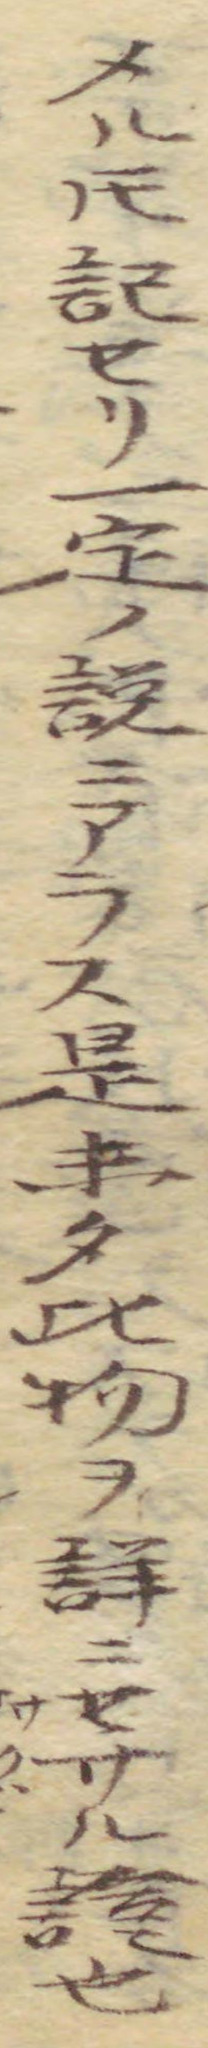メルトモ記セリ一定ノ説ニアラス是未タ此物ヲ詳ニセサル証也
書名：鶯宿雑記. 巻263-264
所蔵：国立国会図書館 National Diet Library, JAPAN
